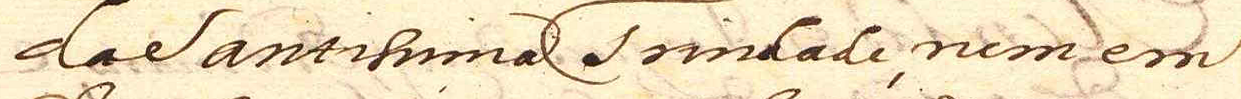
da Santissima Trindade, nem em
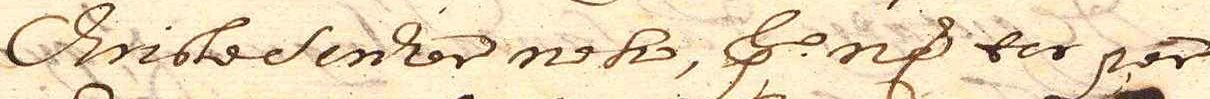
Christo senhor nosso, p.lo naõ ter por
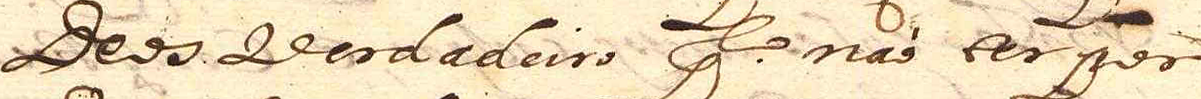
Deos Verdadeiro p.lo naõ ter por
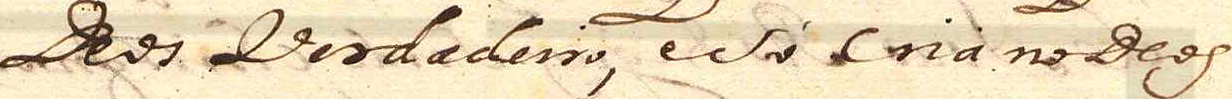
Deos Verdadeiro, e só cria no Deos
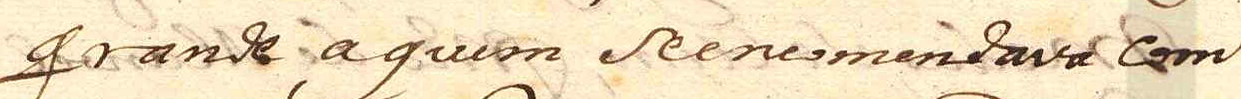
grande, a quem se encomendava com
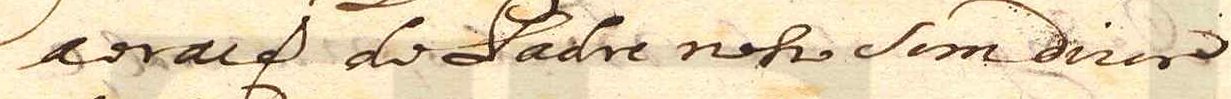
a oraçaõ do Padre nosso sem dizer
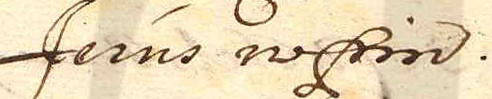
Jesús no fim.
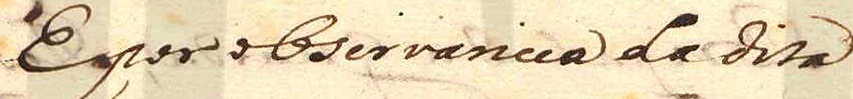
E por observancia da dita
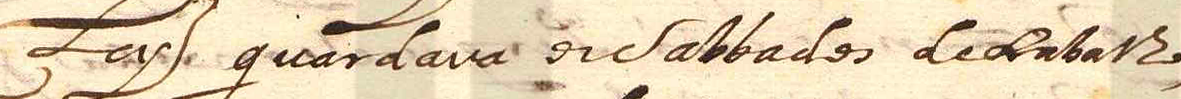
Ley guardava os Sabbados de trabalho,
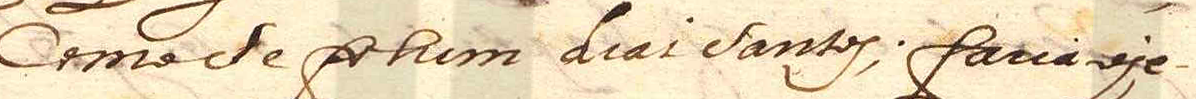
Como se fossem dias santos; fazia o je
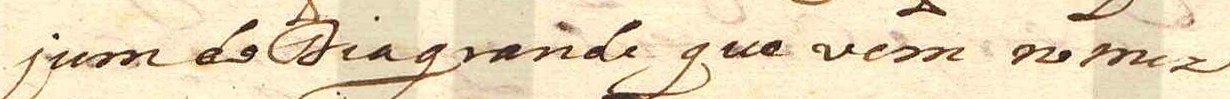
jum do Dia grande, que vem no mez
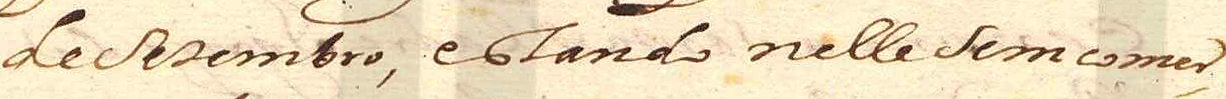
de setembro, estando nelle sem comer,
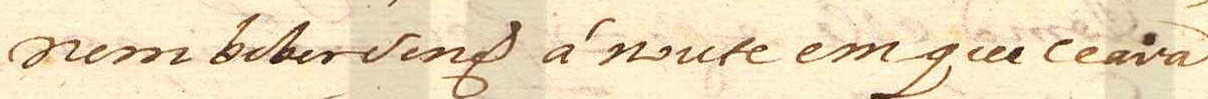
nem beber senaõ á noute em que ceava
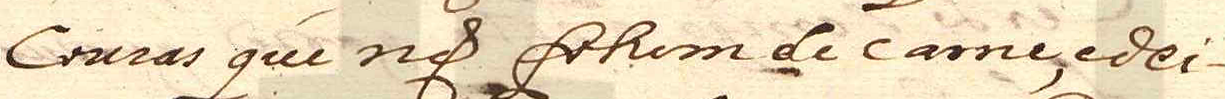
couzas que naõ fossem de carne, e dei
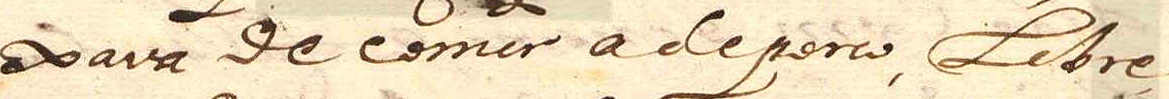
xava de comer a de porco, Lebre,
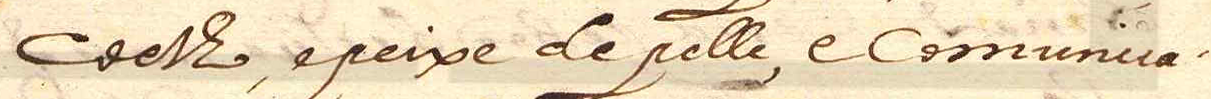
Coelho, e peixe de pelle, e Comunica
